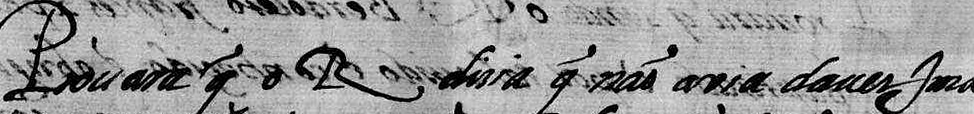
Prouara q̄ o R. dizia q̄ naõ avia dauer Jma
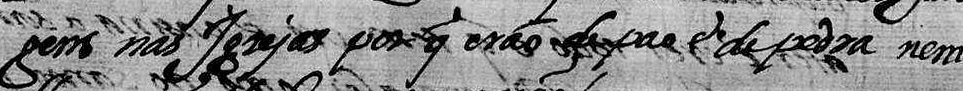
gens nas Jgrejas porq̄ eraõ de pao e de pedra nem
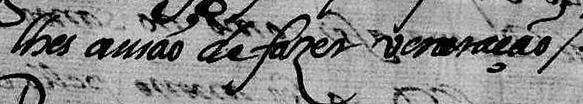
lhes auião de fazer veneração /.
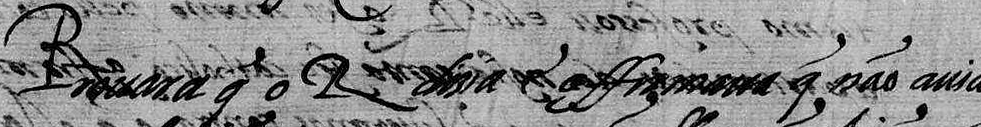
Prouara q̄ o R dizia e afirmaua q̄ naõ auia
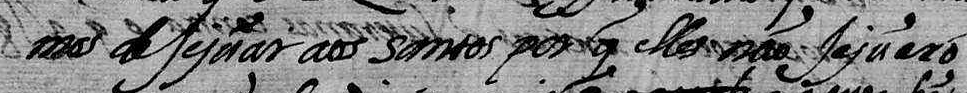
mes de Jejūar os santos porq̄ elles naõ Jejūarō
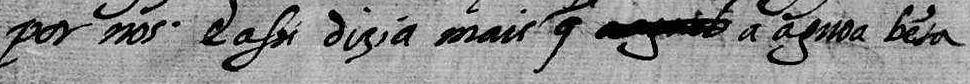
por nos. e assi dizia mais q̄ _ a aguoa bēta
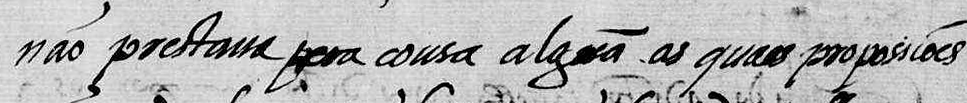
naõ prestaua pera cousa alguā as quaes proposições
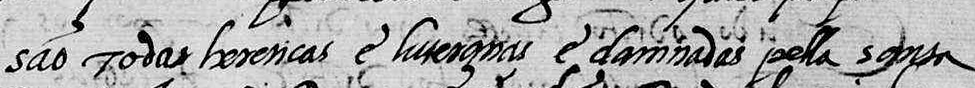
são todas hereticas e luteranas e damnadas pella santa
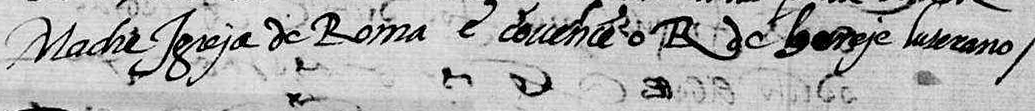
Madre Jgreja de Roma e cōuencē o R de hereje luterano /
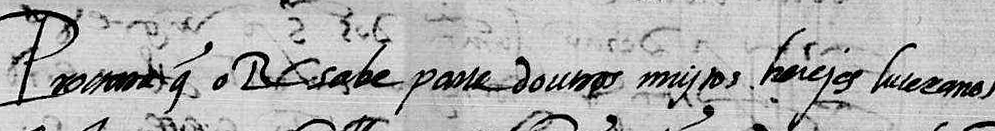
Prouara q̄ o R sabe parte doutros mujtos herejes luteranos
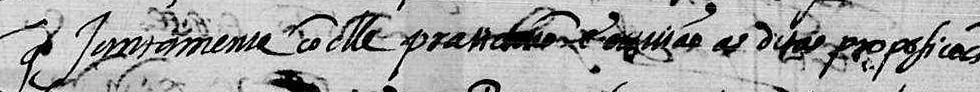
q̄ Jumtamente cō elle praticauō e ouuiaõ as ditas proposiçoẽs
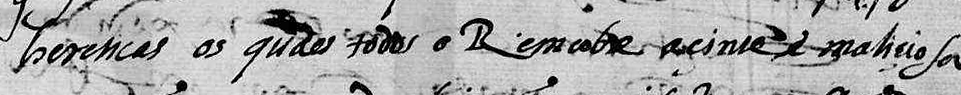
hereticas os quaes todos o R. emcobre acinte e maliciosa
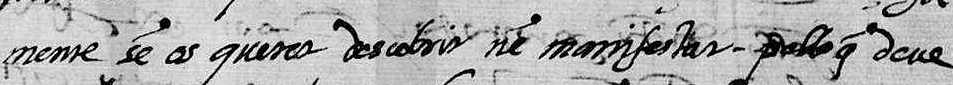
mente sē os querer descobrir ne̅ manifestar. pello q̄ deue
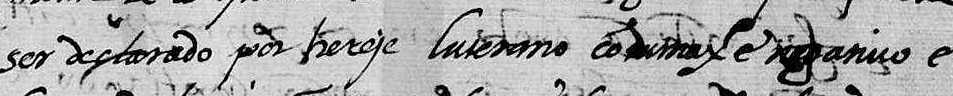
ser declarado por hereje luterano cōtumax e negatiuo e
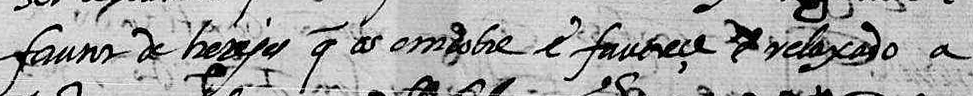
fautor de herejes q̄ os emcobre e fauorece e relaxado a
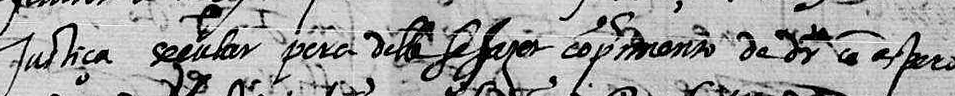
Justiça secular pera delle se fazer cōp̄imento de drto cō aspero
